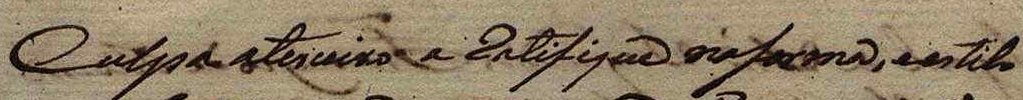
Culpa a terceiro a Retifique na forma, e estilo
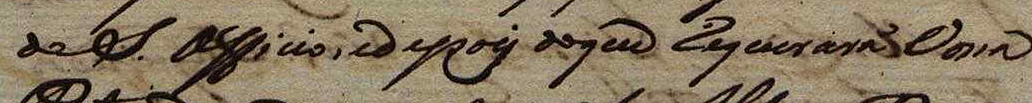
do S. Officio, e depois do que Requerará Vossa
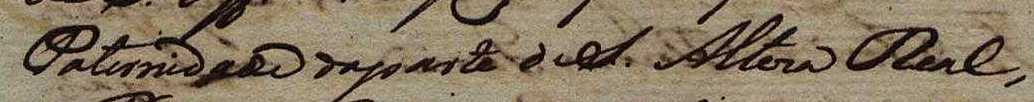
Paternidade da parte de S. Alteza Real,
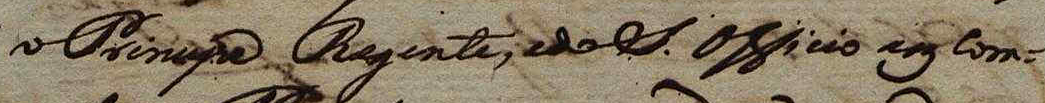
o Principe Regente, e do S. Officio aoz com
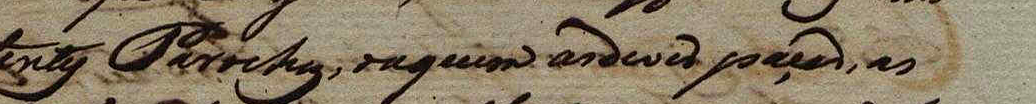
petentes Parochoz, ou quem as dever paçar, as
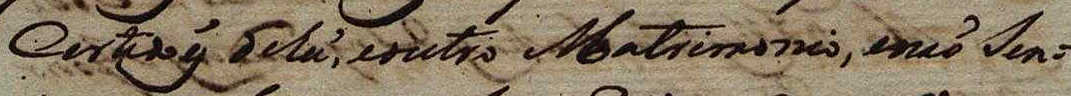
Certidoẽs de hū, e outro Matrimonio, e naõ Sen
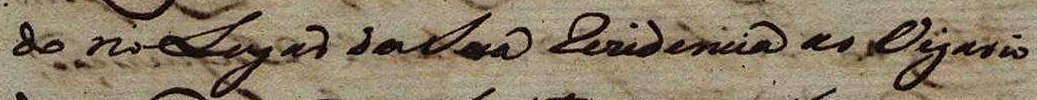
do no Lugar da Sua Rezidencia ao Vigario
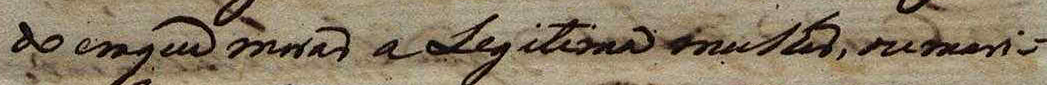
do em que morar a Legitima mulher, ou mari
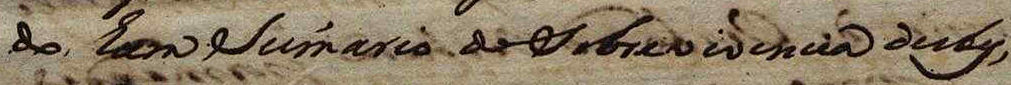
do, hum Sumario de Sobrevivencia destes
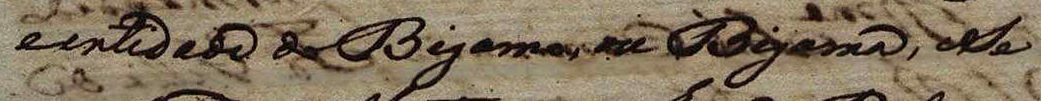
e entidade do Bigamo ou Bigama, e Se
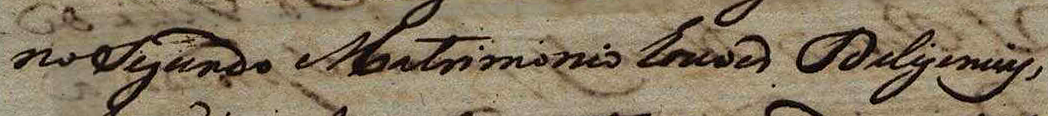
no Segundo Matrimonio houver Diligencias,
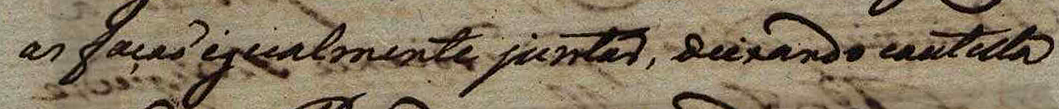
as façaõ igualmente juntar, deixando cautella
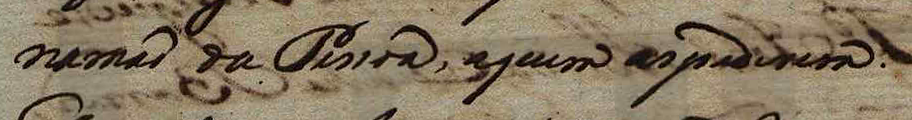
na maõ da Pessoa, a quem as pedirem.
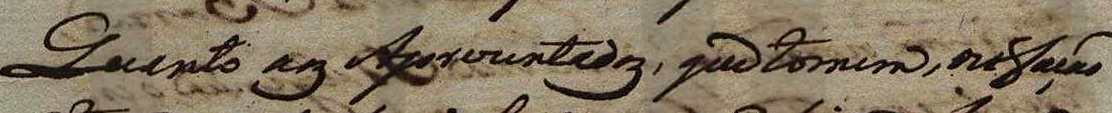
Quanto aoz Aprezentadoz, que tomem, ou façaõ
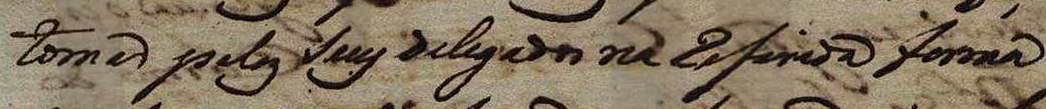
tomar pelos seus delegados na Referida forma
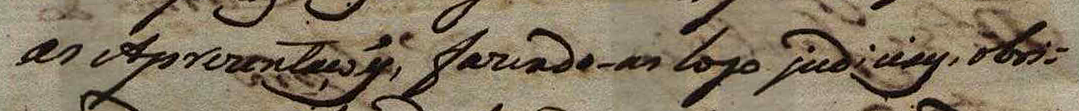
as Aprezentaçoẽs, fazendo-as logo judiciaes, obri
